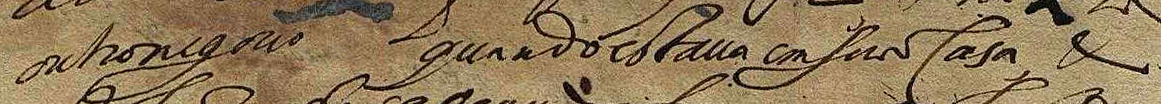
outro negocio quando estaua em sua Casa, &
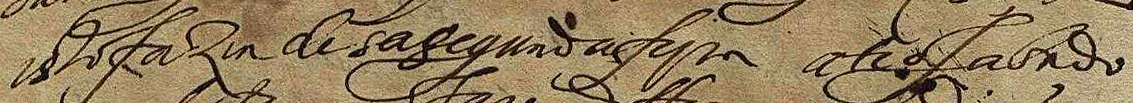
isto fazia des a segunda fejra ate o Sabado
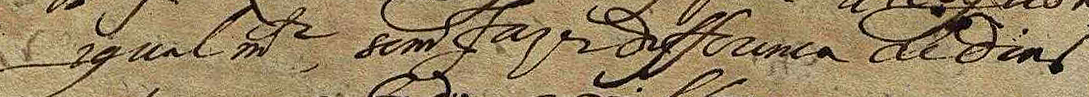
igualmte, sem fazer differença de dias
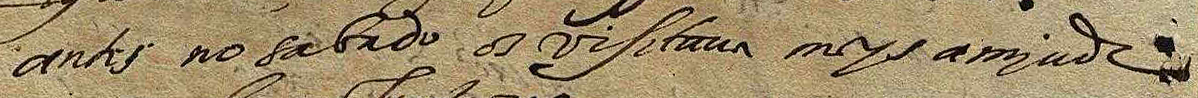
antes no sabado os visitaua mays amjude
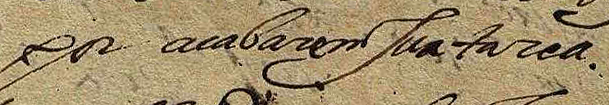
por acabarem sua tarea.
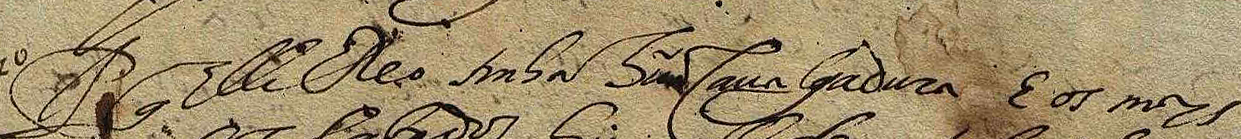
P q̄ Elle Reo tinha huã Caualgadura E os mays
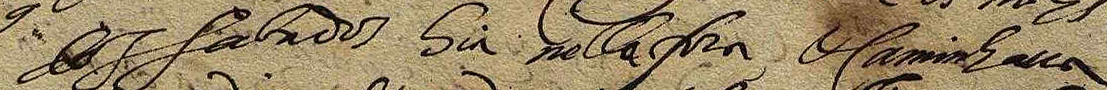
dos Sabados hia nella fora, & Caminhaua
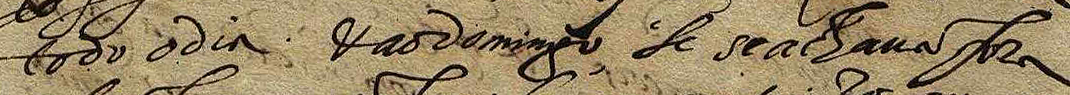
todo o dia. & ao domingo, se se achaua fora
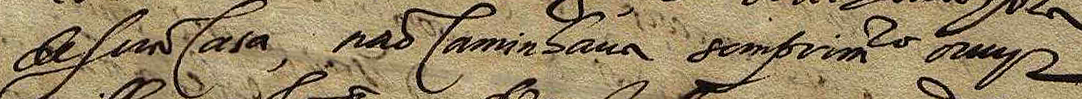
de sua Casa, naõ Caminhaua sem primro ouujr
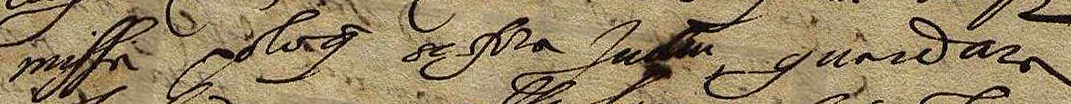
missa polo q̄ se fora Judeu, guardara
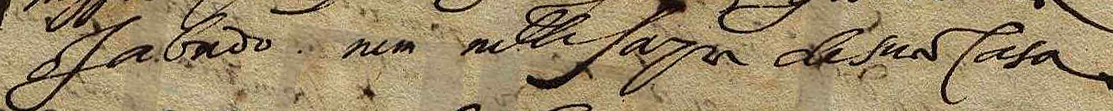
o Sabado . nem nelle sayra de sua Casa
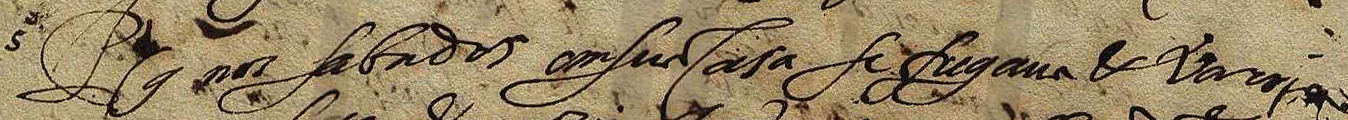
P q̄ nos Sabados em sua Casa se fregaua & Varrja
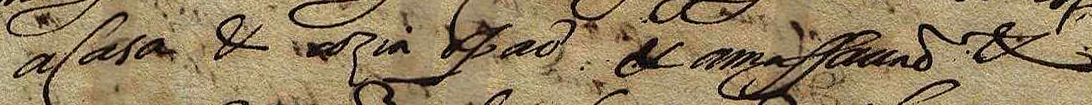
a Casa & cozia o paõ & amassauaõ &
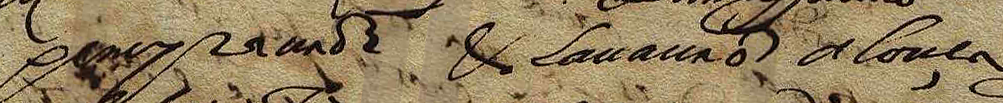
peneyrauaõ & lauauão a louça
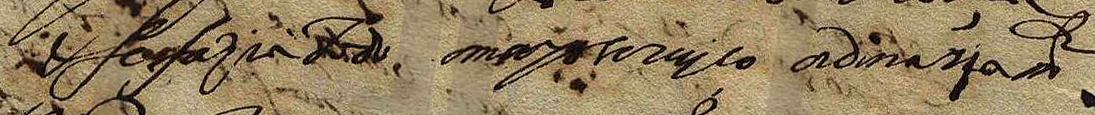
& se fazia todo o mays serujço ordinarjamte
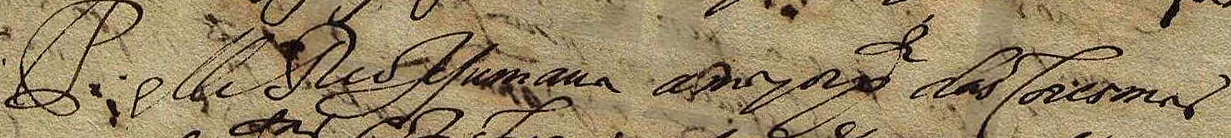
P. Elle Reo Jejumaua a mayor pte das Coresmas
